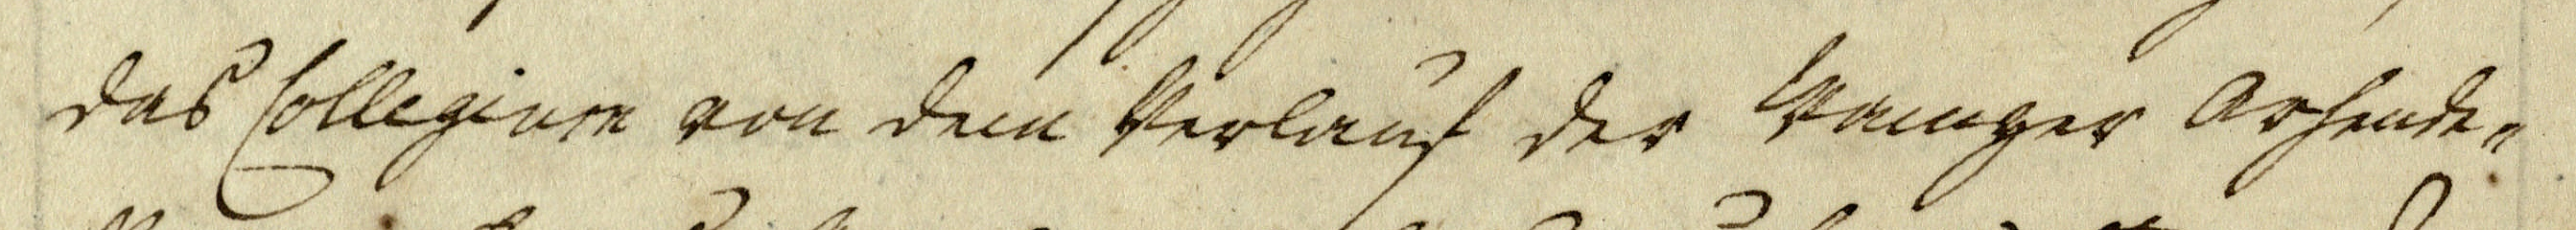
das Collegium von dem Verlauf der Wamper Assende-
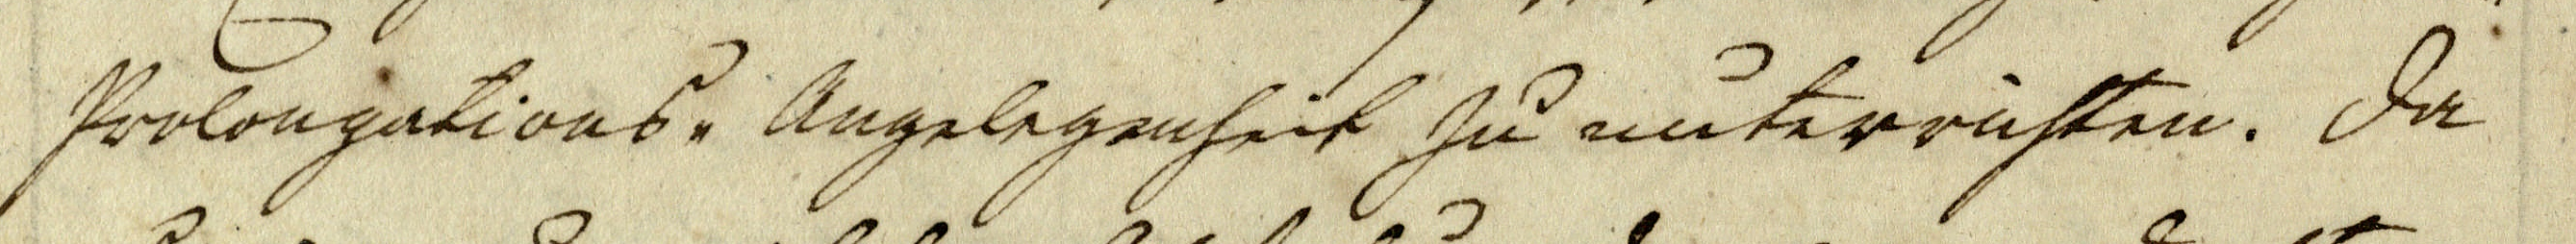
Prolongations- Angelegenheit zu unterrichten. Da
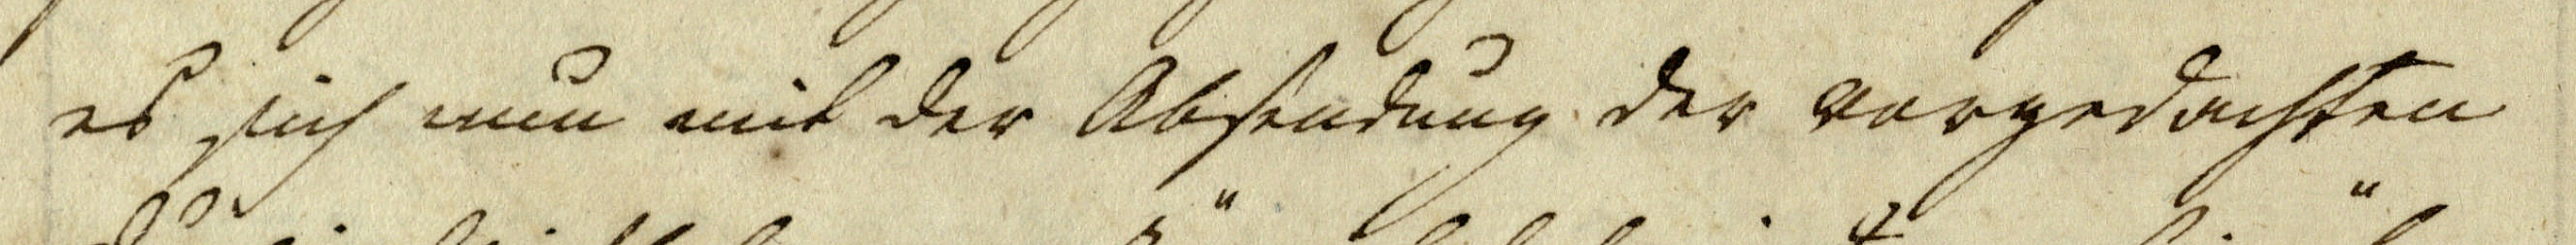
es sich nun mit der Absendung der vorgedachten
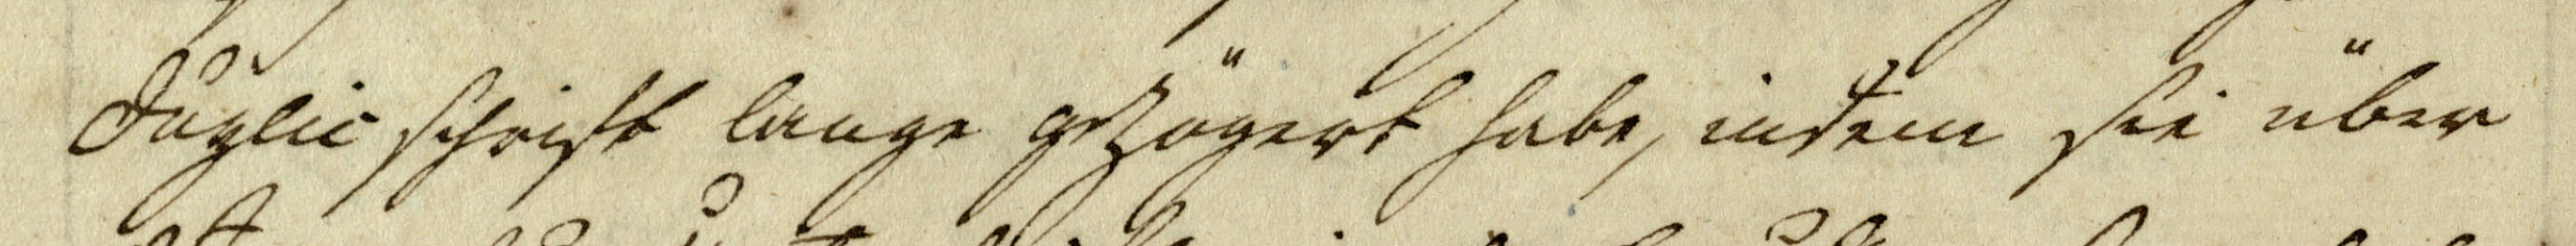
Duplic schrift lange gezögert habe, indem sie über
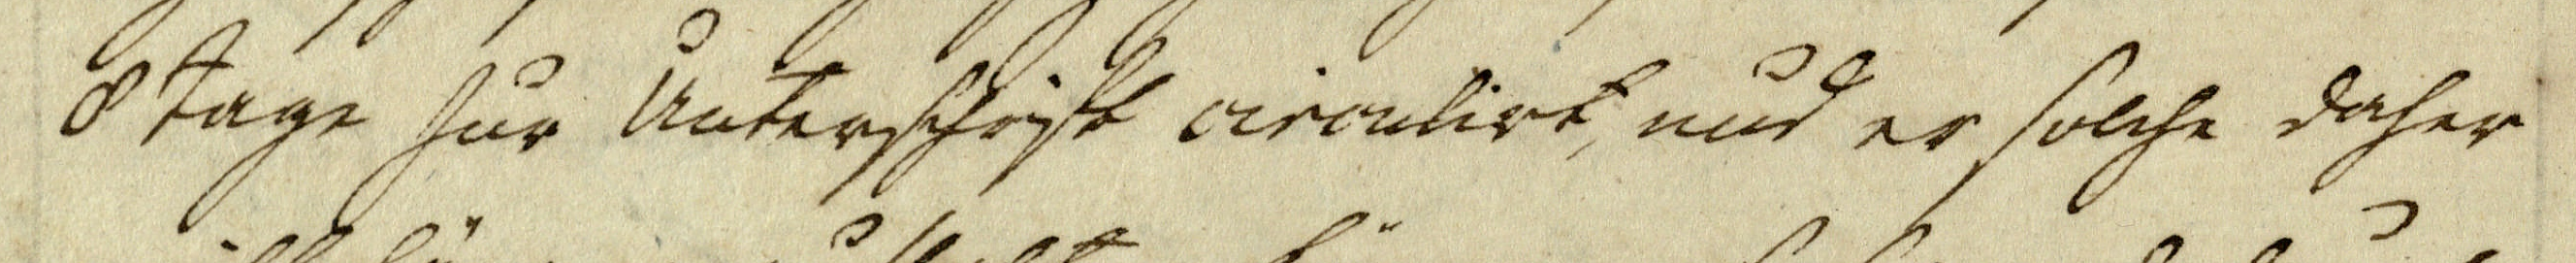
8 Tage zur Unterschrift circulirt und er solche daher
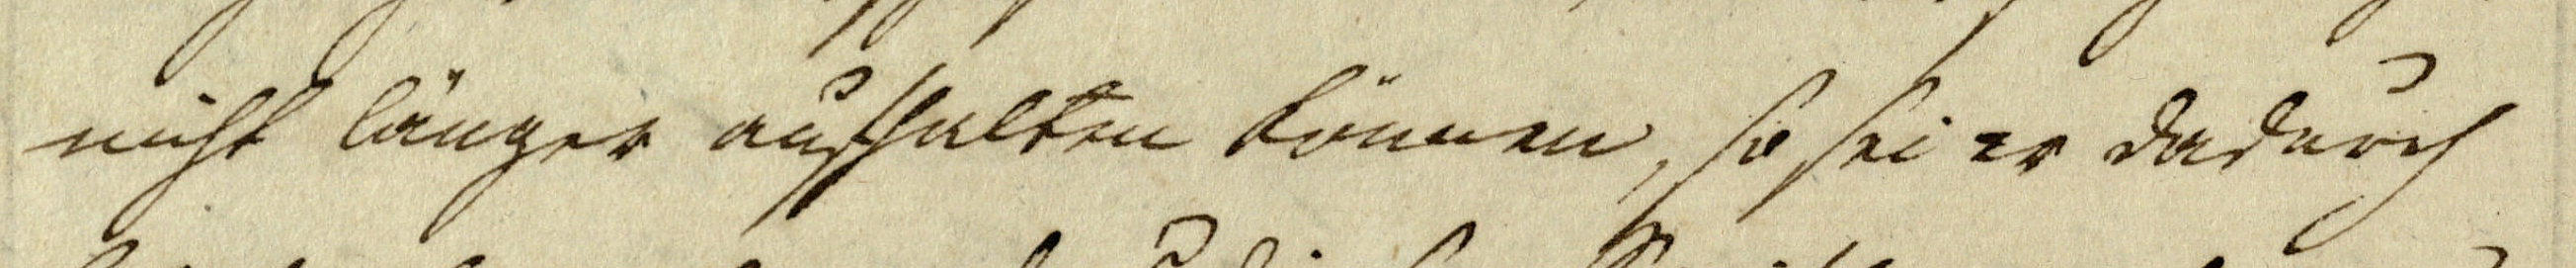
nicht länger aufhalten können, so sei er dadurch
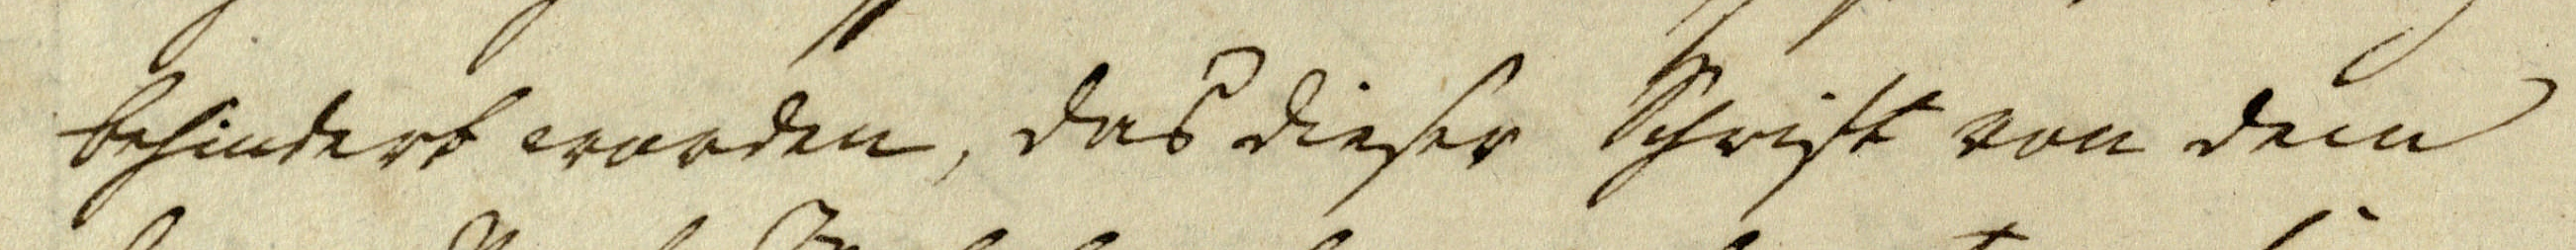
behindert worden, das dieser Schrift von dem
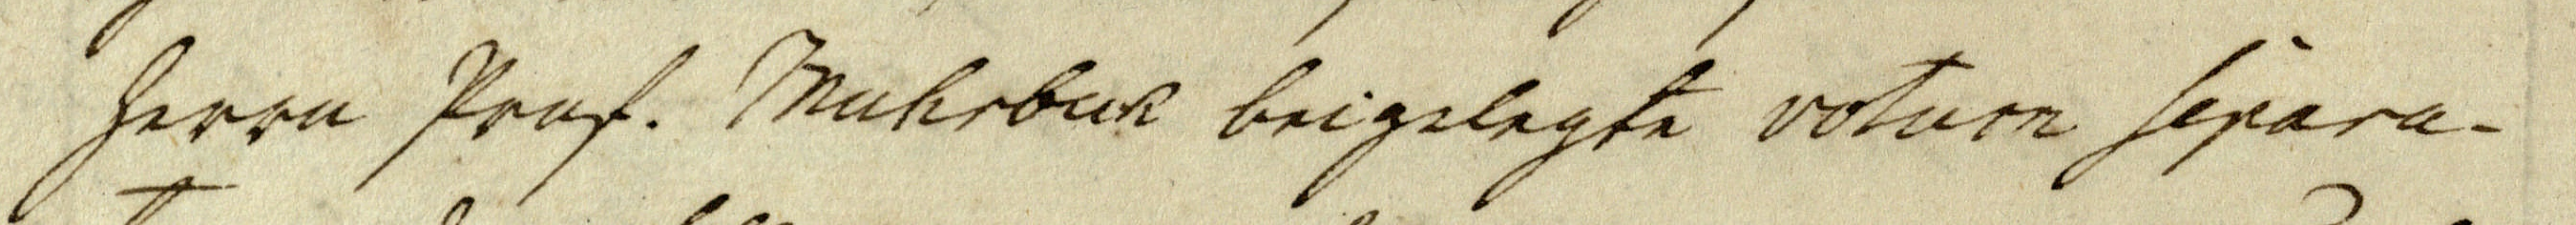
Herrn Prof. Muhrbeck beigelegten votum separa¬
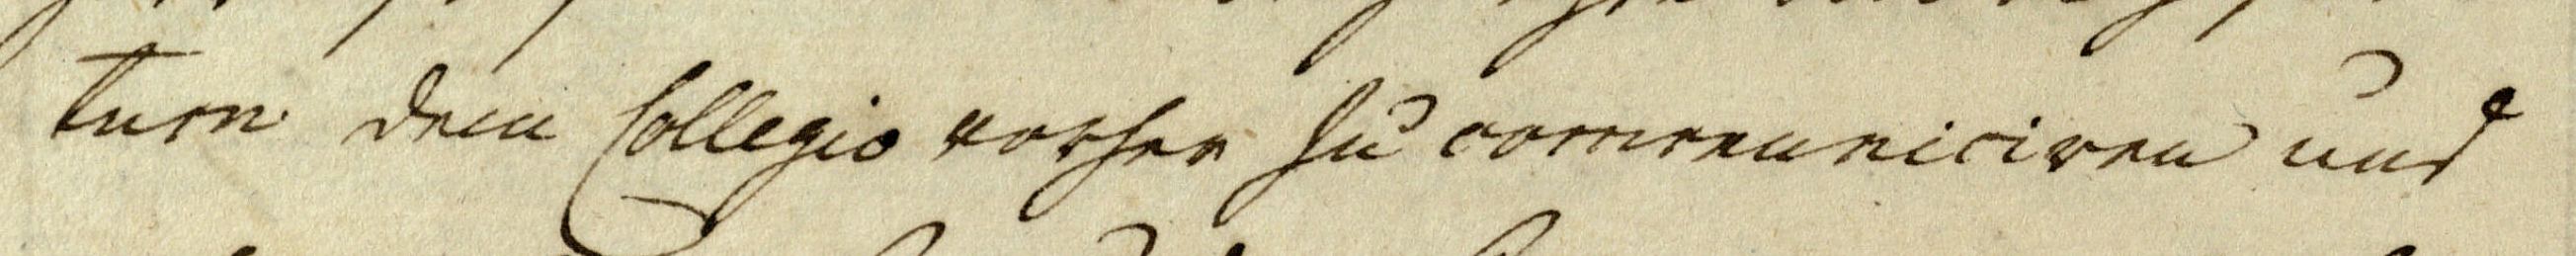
tum dem Collegio vorher zu communiciren und
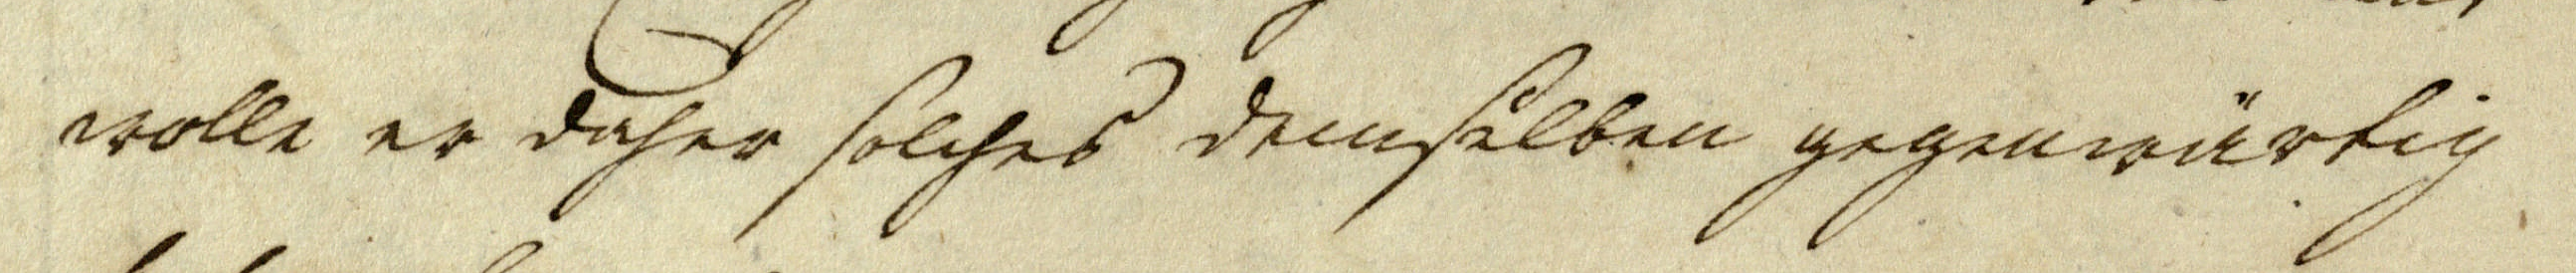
wolle er daher solches demselben gegenwärtig
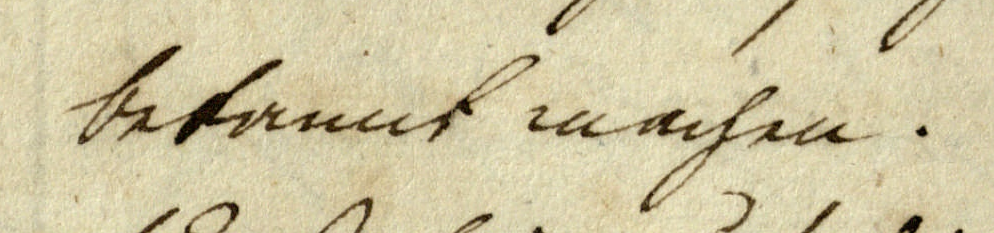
bekannt machen.
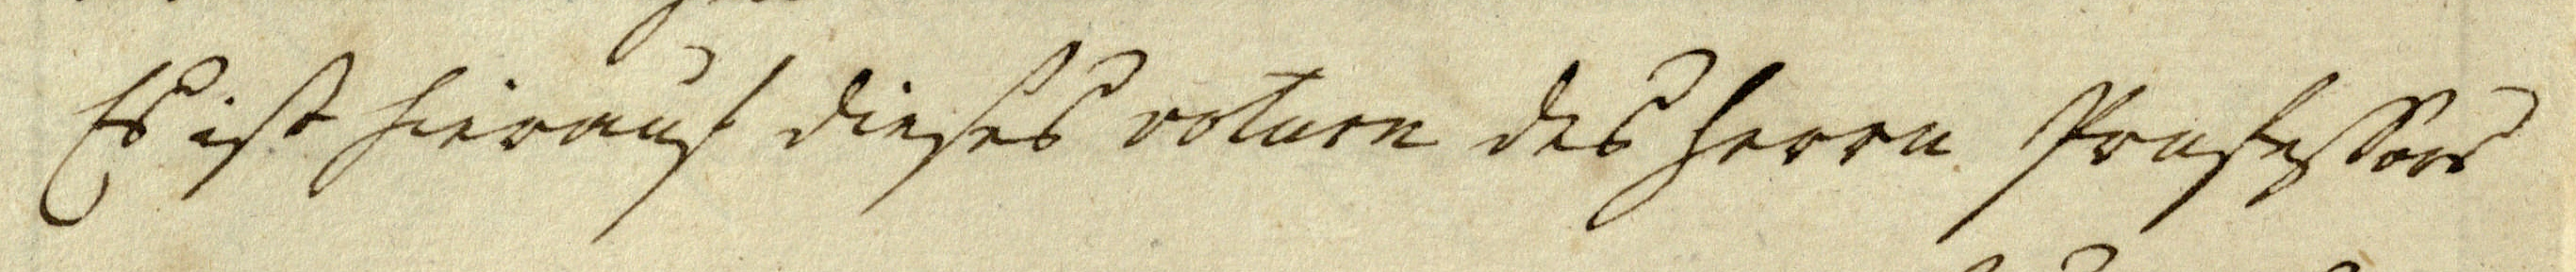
Es ist hierauf dieses votum des Herrn Professors
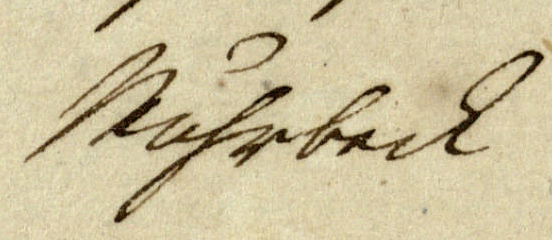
Muhrbeck
